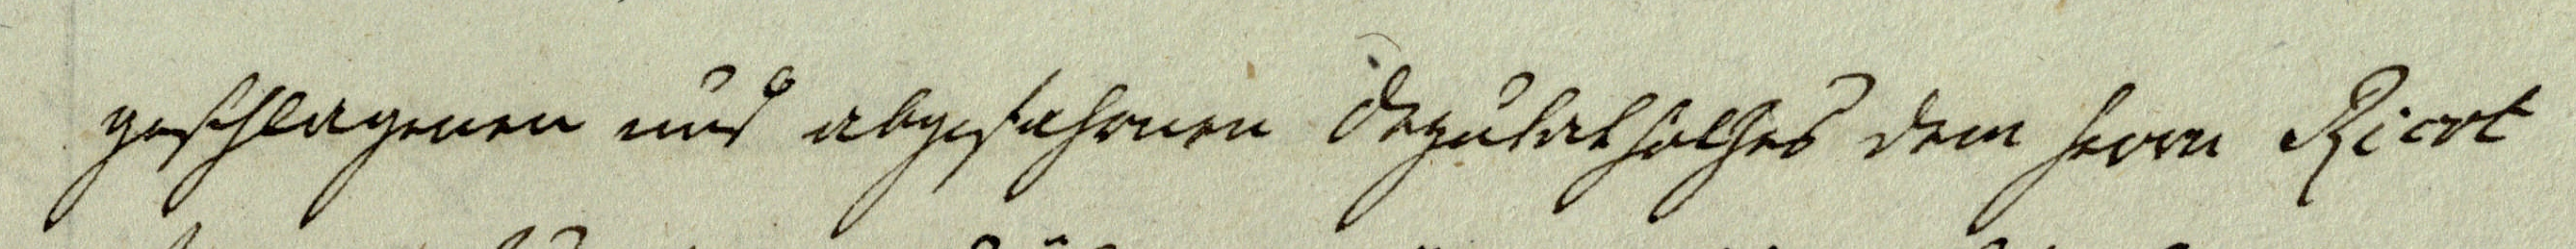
geschlagenen und abgefahrnen Deputatholzes dem Herrn Ricot
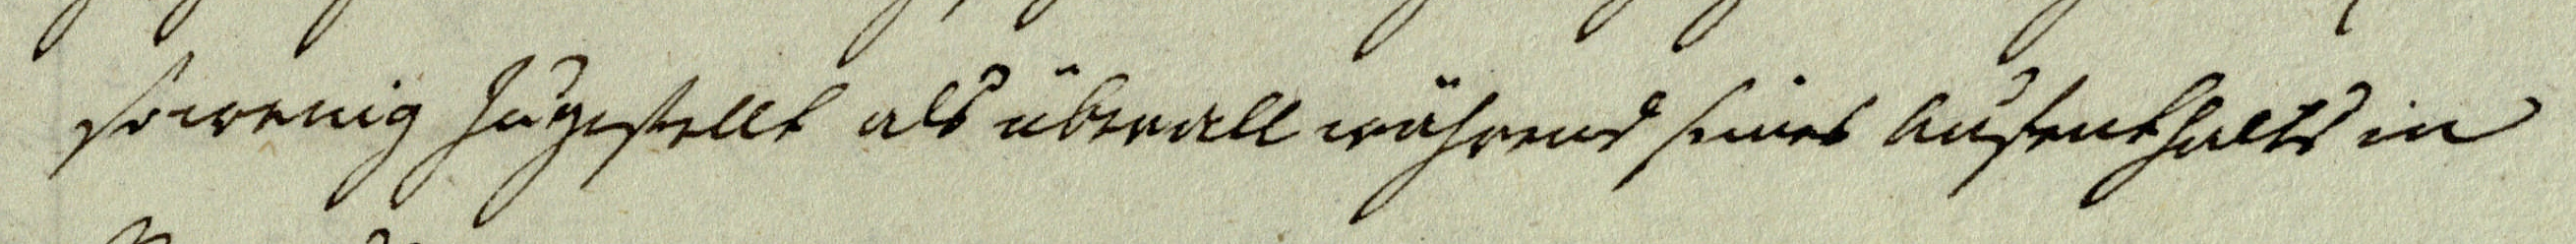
sowenig zugestellt als überall während seines Aufenthalts in
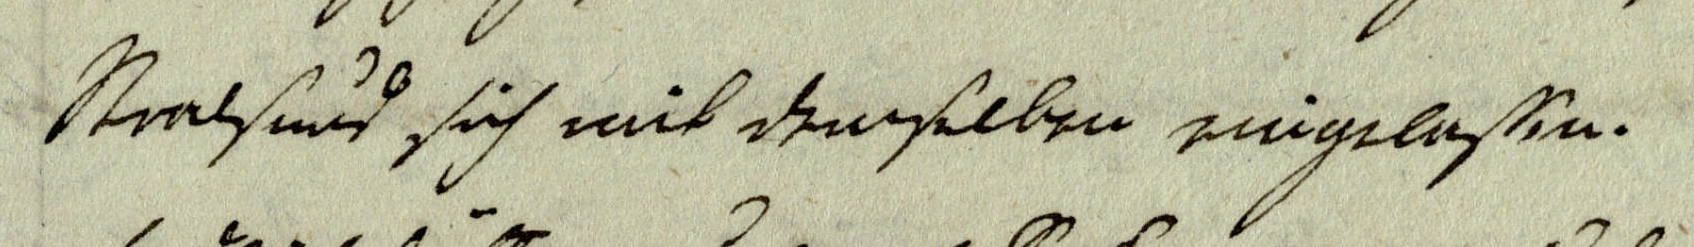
Stralsund sich mit demselben eingelassen.
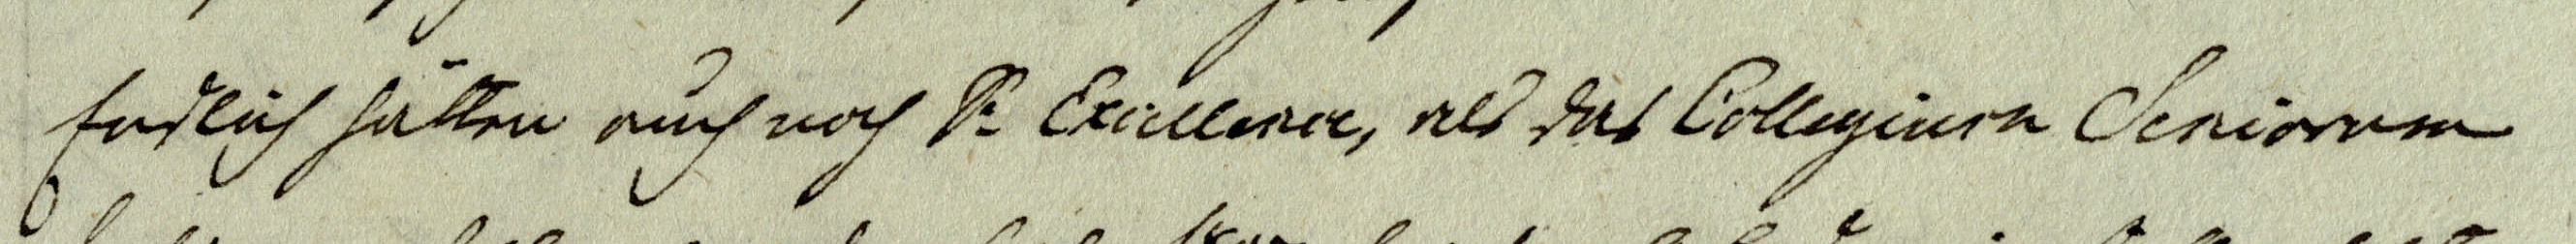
Endlich hätten auch noch Sr Excellence, als das Collegium Seniorum
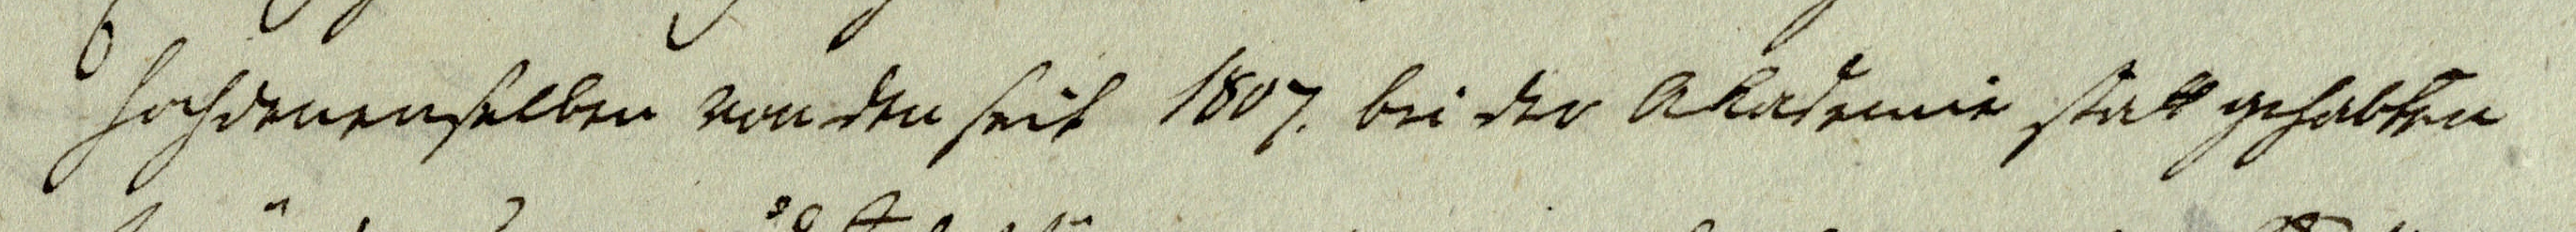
Hochdenenselben von den seit 1807. bei der Akademie statt gehabten
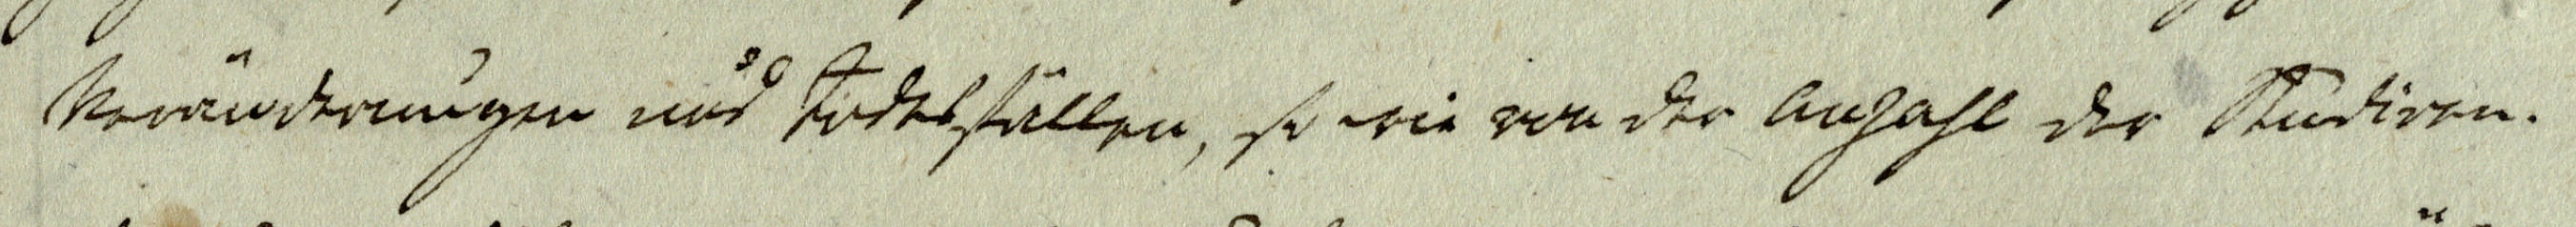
Veränderungen und Todesfällen, so wie von der Anzahl der Studiren¬
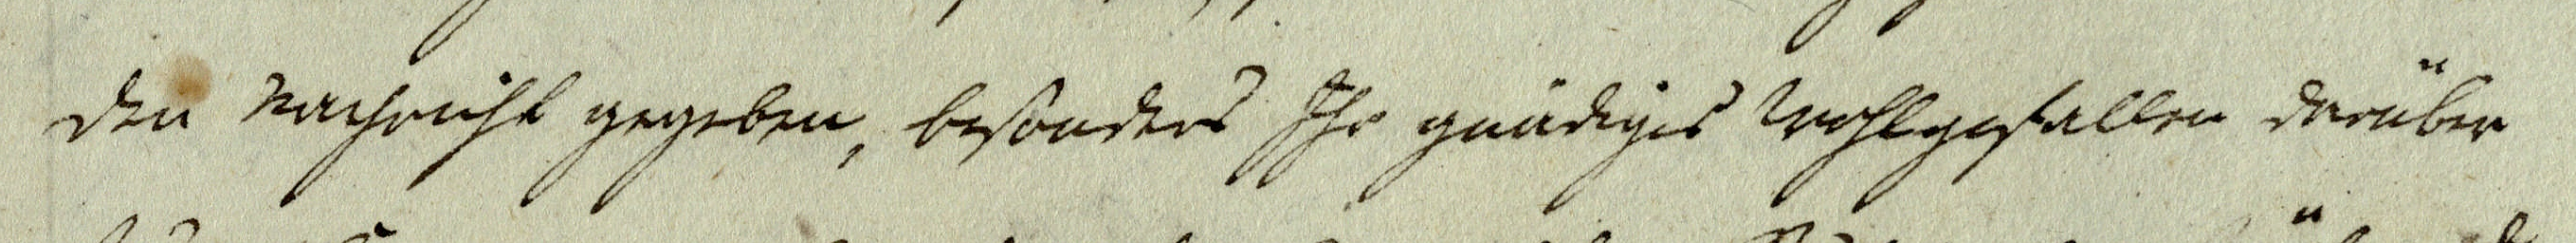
den Nachricht gegeben, besonders Ihr gnädiges Wohlgefallen darüber
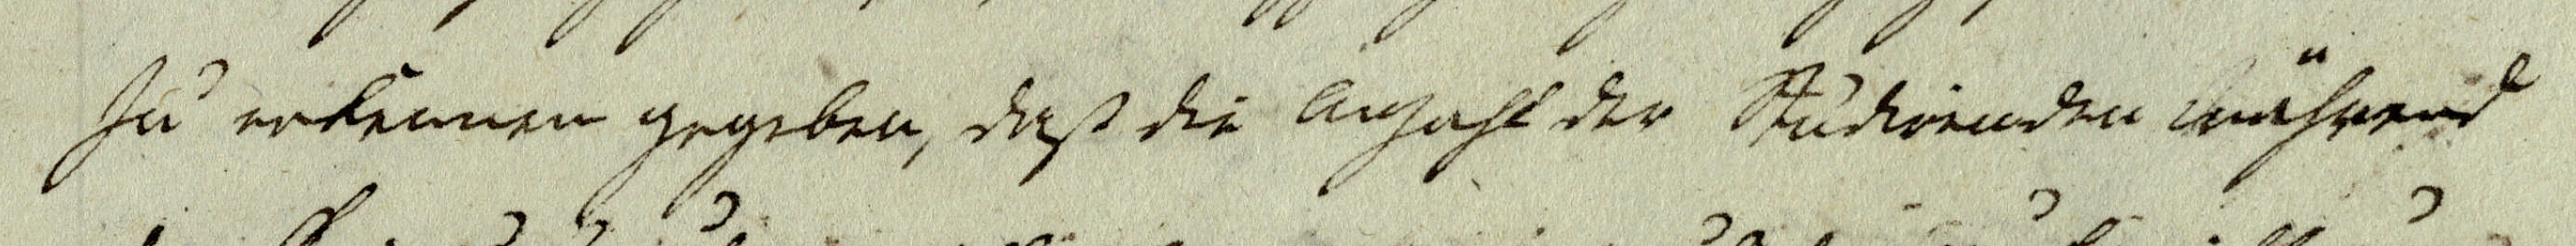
zu erkennen gegeben, daß die Anzahl der Studirenden während
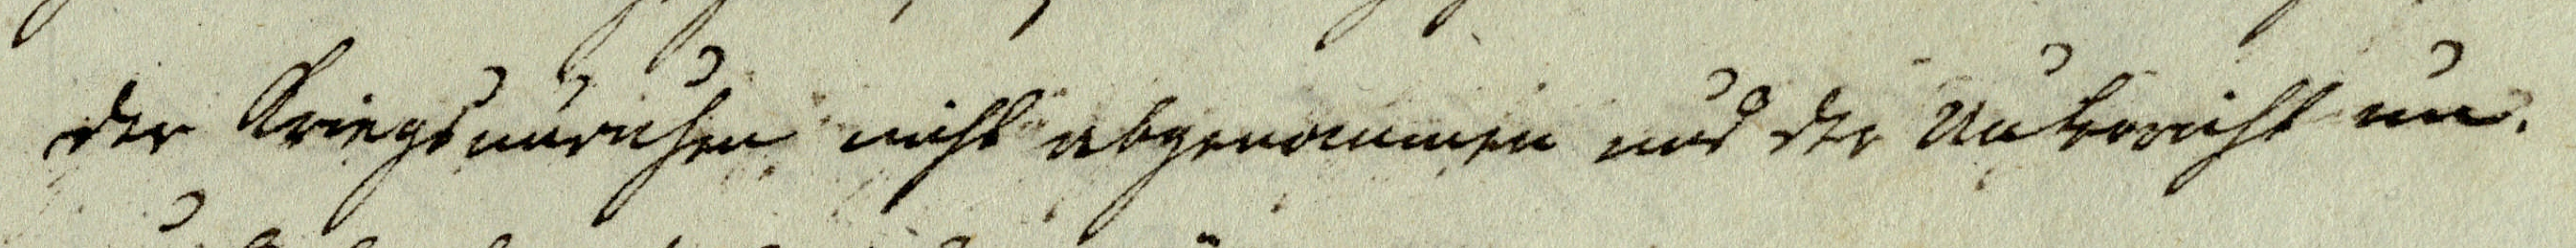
der Kriegsunruhen nicht abgenommen und der Unterricht un¬
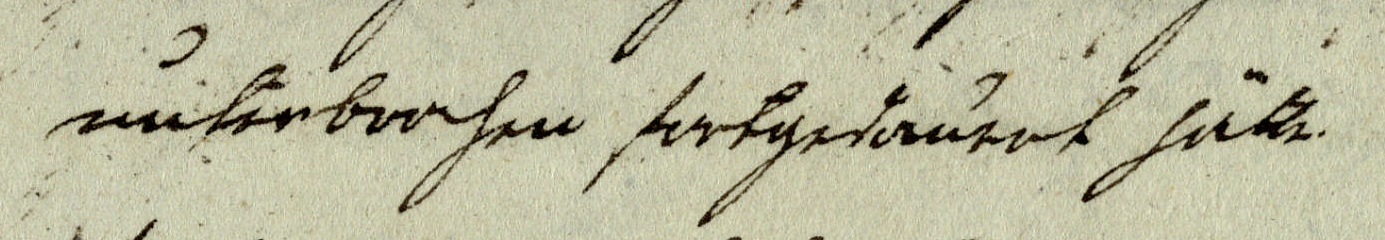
unterbrochen fortgedauert hätte.
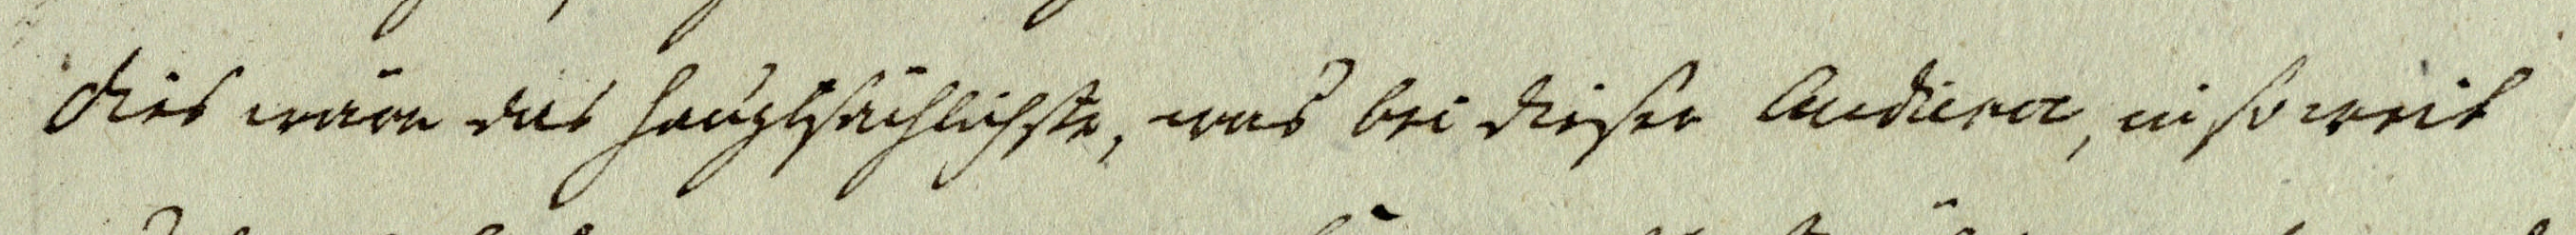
Dies wäre das Hauptsächlichste, was bei dieser Audience, in so weit
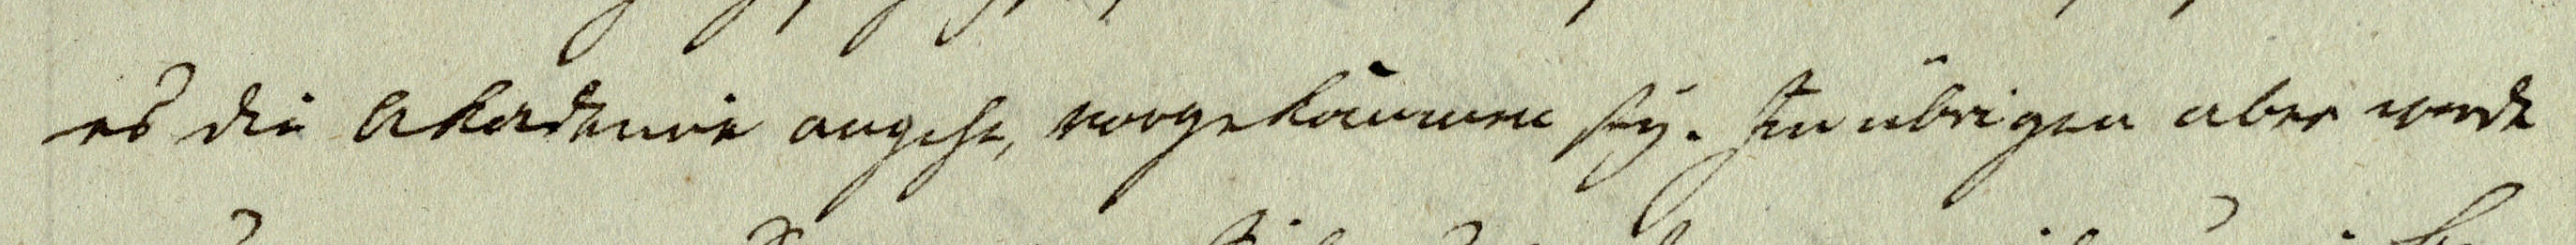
es die Akademie angehe, vorgekommen seÿ. Im übrigen aber werde
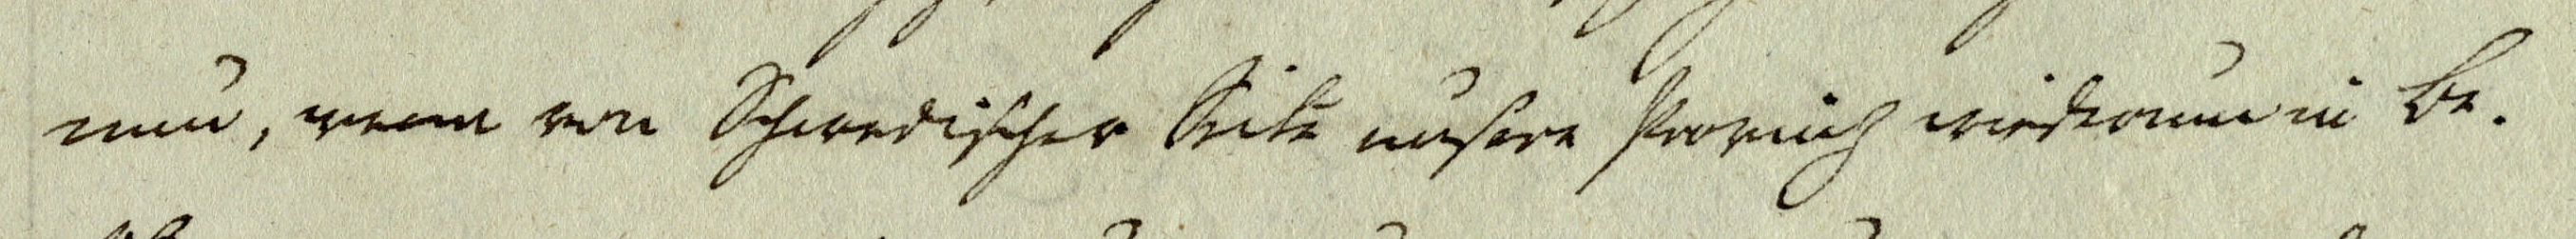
nun, wenn von Schwedischer Seite unsere Provinz wiederum in Be¬
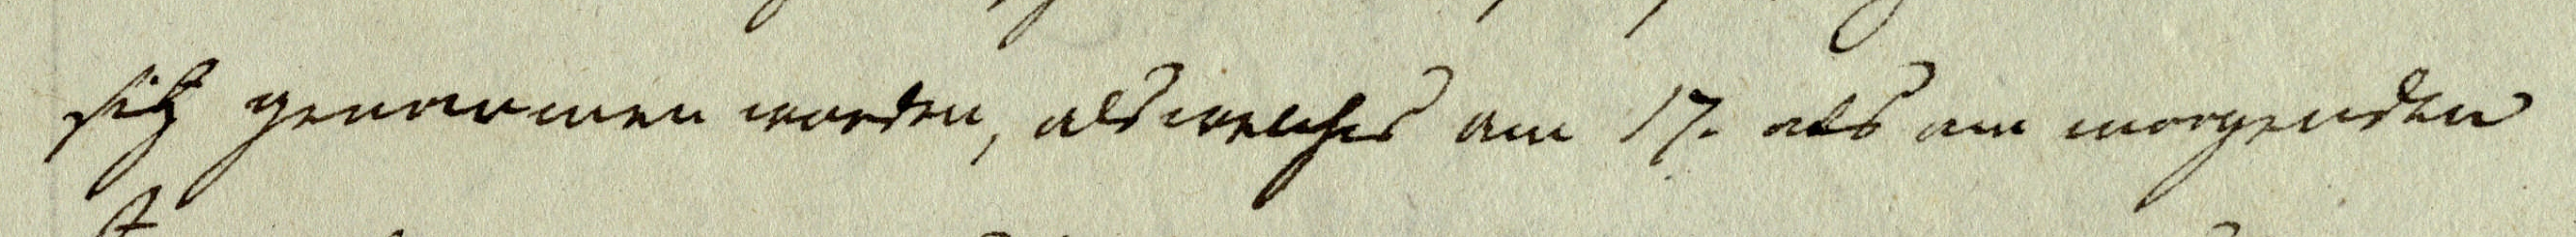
sitz genommen worden, als welches am 17. als am morgenden
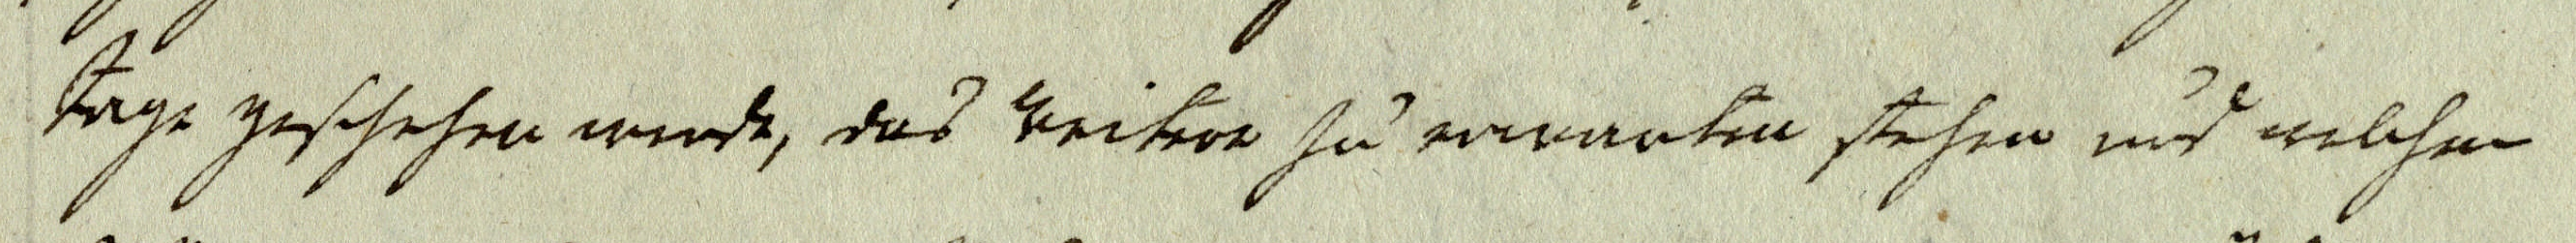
Tage geschehen werde, das Weitere zu erwarten stehen und welchen
